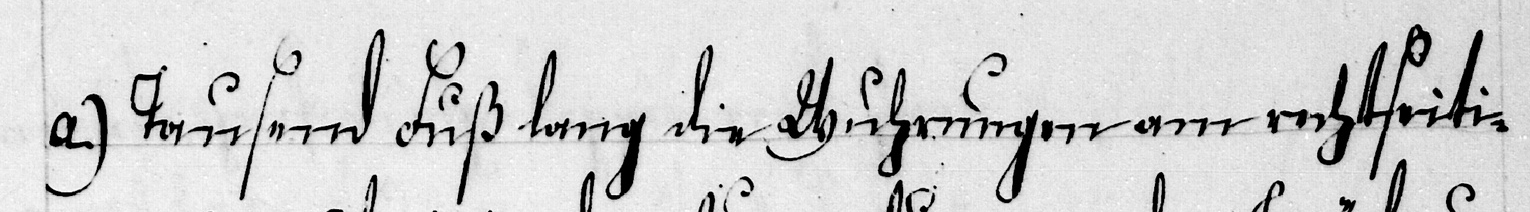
a.) Tausend Fuß lang die Wuhrungen am rechtseiti¬
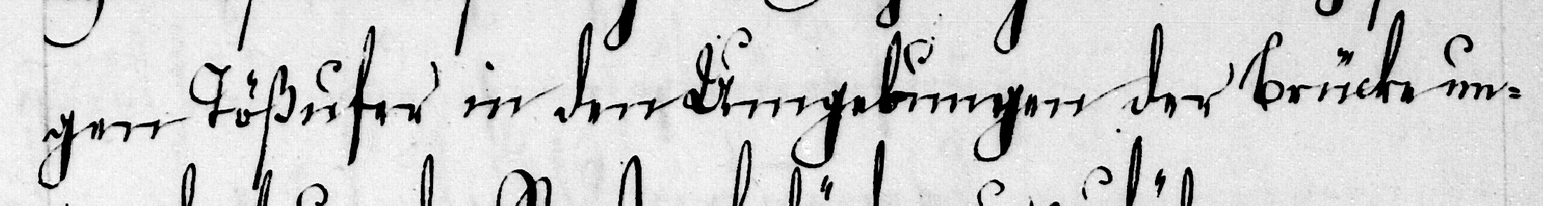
gen Tößufer in den Umgebungen der Brücke un¬
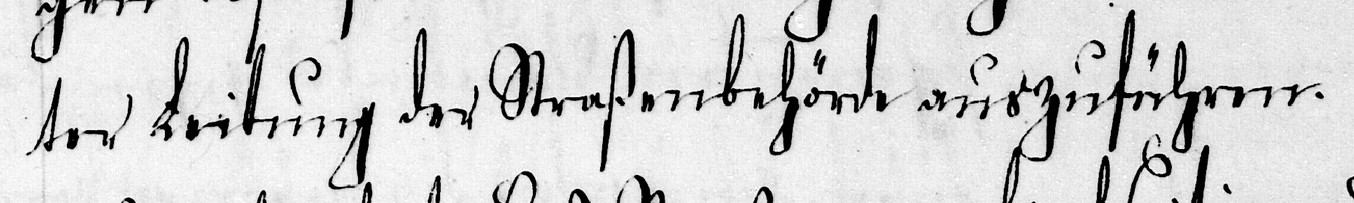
ter Leitung der Straßenbehörde auszuführen.
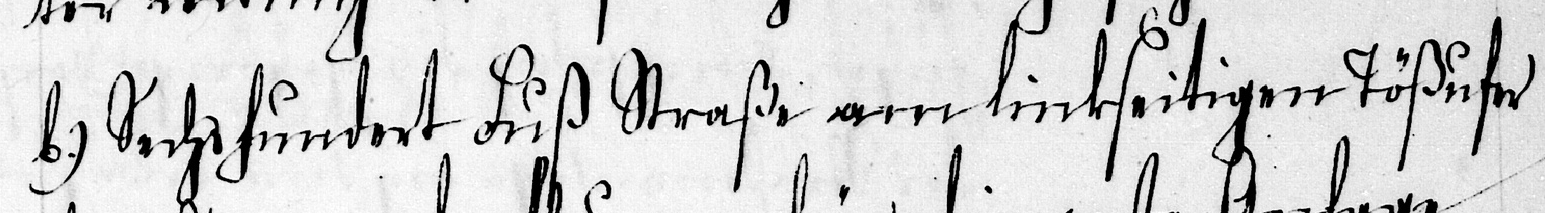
b.) Sechshundert Fuß Straße am linkseitigen Tößufer
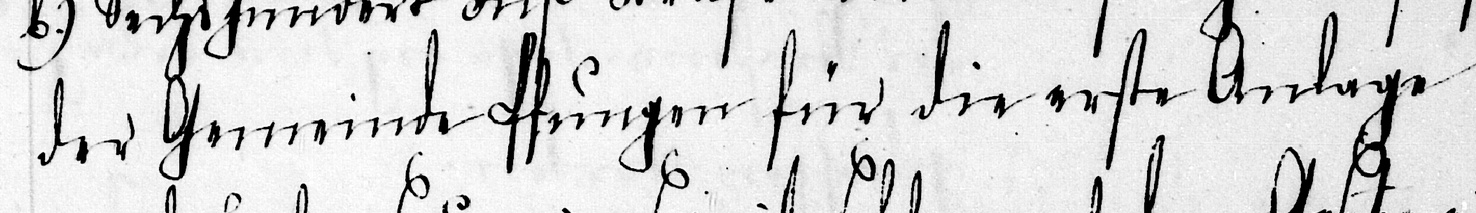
der Gemeinde Pfungen für die erste Anlage
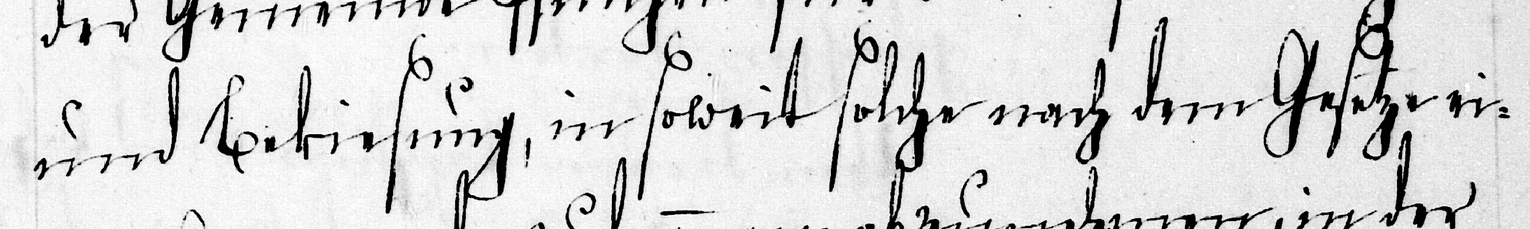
und Bekiesung, in soweit solche nach dem Gesetze e¬
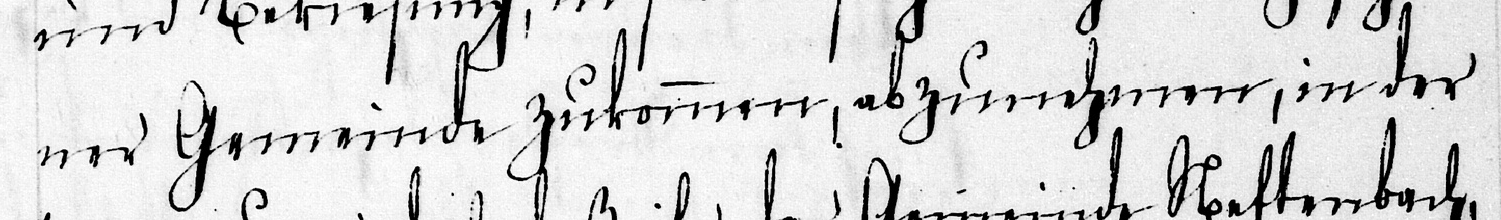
iner Gemeinde zukommen, abzunehmen, in der
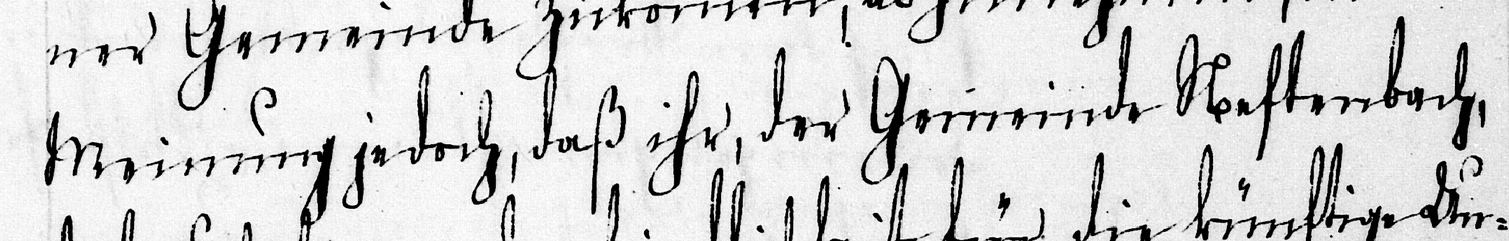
Meinung jedoch, daß ihr, der Gemeinde Neftenbach,
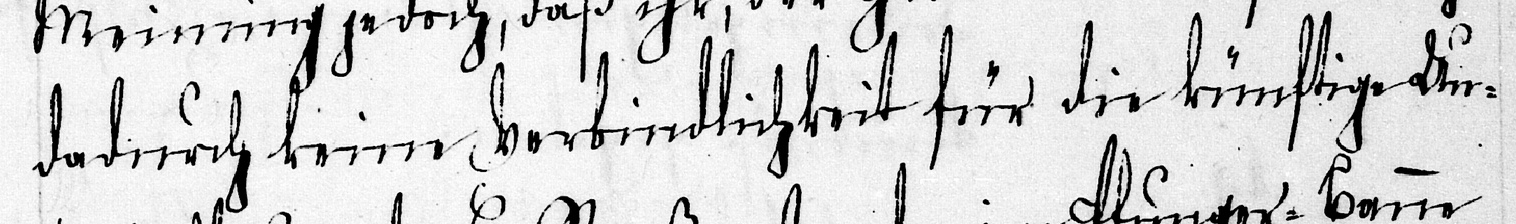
dadurch keine Verbindlichkeit für die künftige Un¬
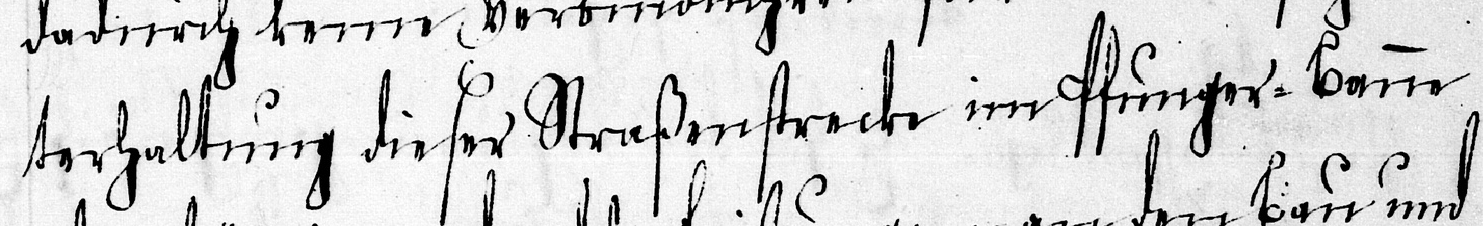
terhaltung dieser Straßenstrecke im Pfunger-Banne
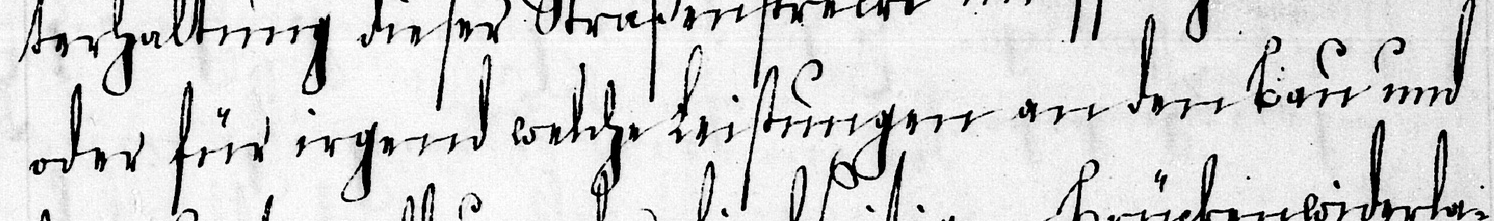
oder für irgend welche Leistungen an den Bau und
